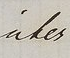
wendig,
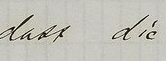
dass die
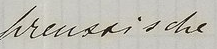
preussische
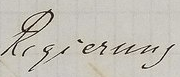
Regierung
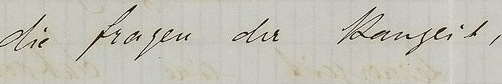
die Fragen der Bauzeit,
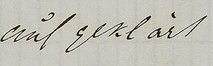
aufgeklärt
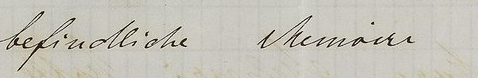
befindliche Memoire
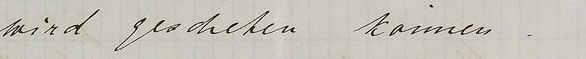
wird geschehen können.
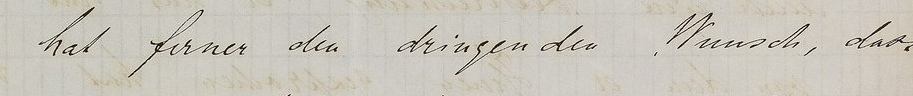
hat ferner den dringenden Wunsch, dass
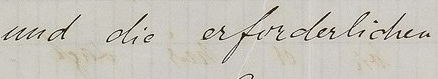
und die erforderlichen
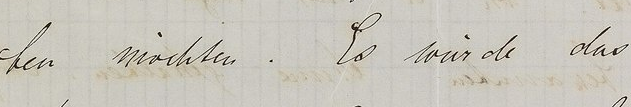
ben möchten. Es würde das
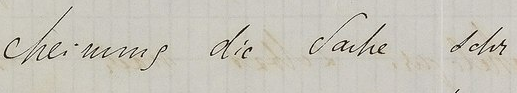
Meinung die Sache sehr
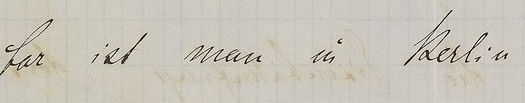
bar ist man in Berlin
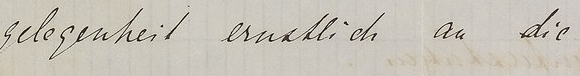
gelegenheit ernstlich an die
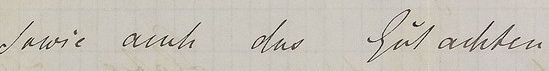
sowie auch das Gutachten
